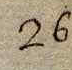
26
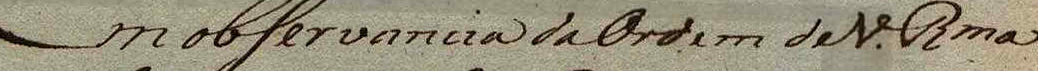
Em observancia da Ordem de V. R.ma
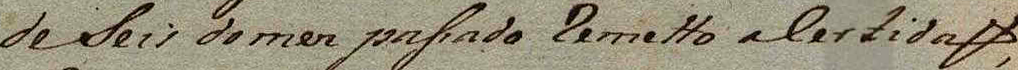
de Seis do mez passado Remetto aCertidaõ,
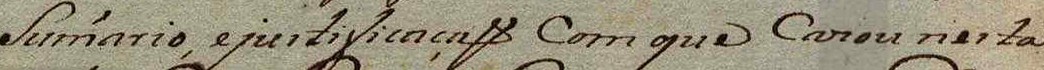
Sumário, e justificaçaõ com que Cazou nesta
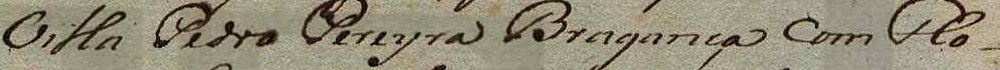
Villa Pedro Pereyra Bragança com Flo
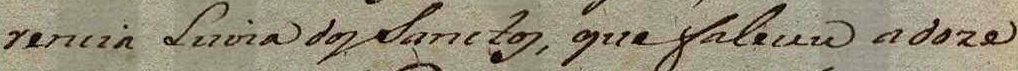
rencia Luiza dos Sanctos, que faleceu a doze
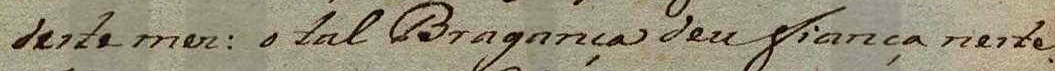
deste mez: o tal Bragança deu fiança neste
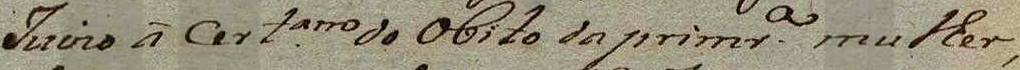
Iuizo á Cert.am do Obito da primr.a mulher,
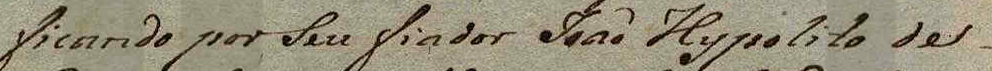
ficando por seu fiador Ioão Hypolito de
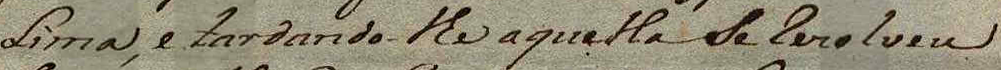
Lima, e tardando-lhe aquella Se Rezolveu
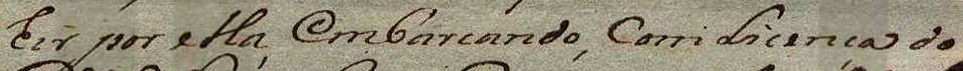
hir por ella, Embarcando, Com licença do
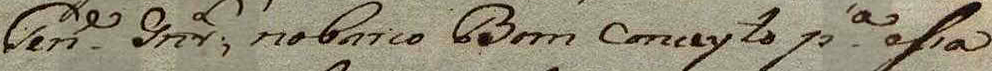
Tene. Gnr.l; no barco Bom Conceyto p.a essa
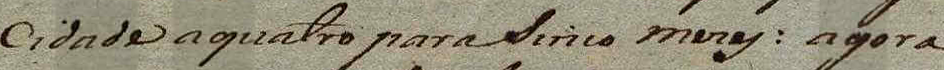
cidada a quatro para Sinco mezes: agora
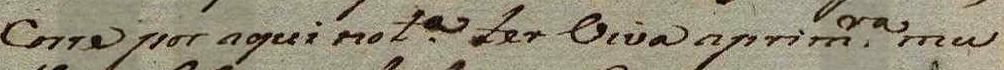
Corre por aqui not.a ter Viva a prim.ra mu
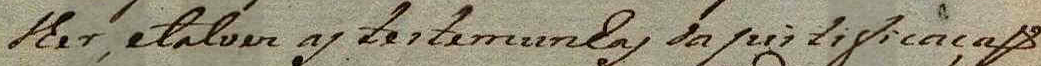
lher, e talvez as testemunhas da justificaçaõ
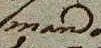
mando
